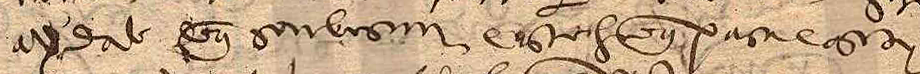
a ꝟdade do q̄ soubesem e ysto he o q̄ pasa e se ty
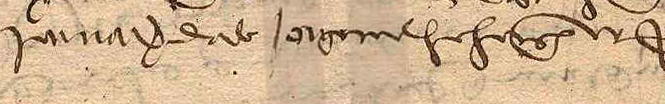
rou na ꝟdade Jorge coelho ho esp̄vy
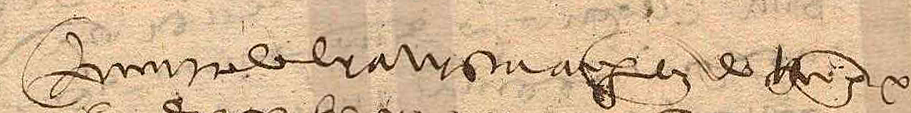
E concertado dey a vysta ao ꝑdor do Reo p̄so
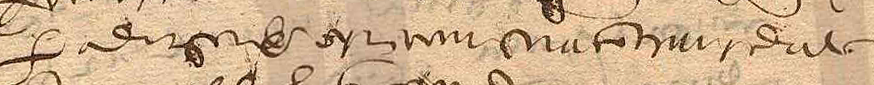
ꝑa dizer e vyr com sua cōtraryedade
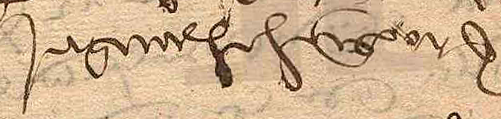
Jorge coelho ho esp̄vy
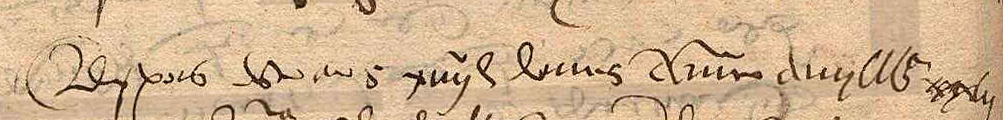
E despois desto aos xiiijo d do mes de m̄ço de mjll bc xxxbij
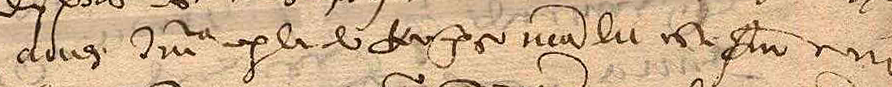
anos ē eura o ꝑdor do Reo p̄so mādou este fct̄o com
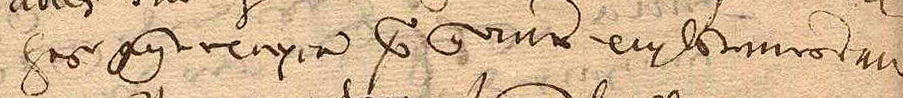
ha seguj̄te exeyçā p̄oq̄ viu ē xiij deste mes ē au
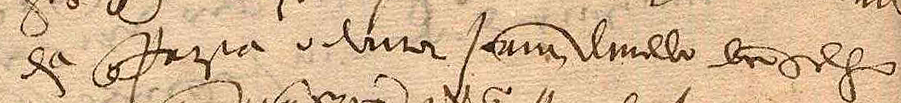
dja q̄ fazia o doutor Joam de mello do cōselho
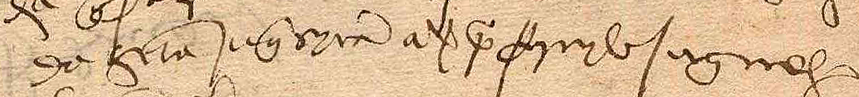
da sāta Jnq̄syçā aꝟ p̄o ferydo Jorge coelho
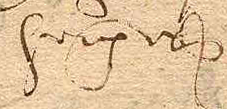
ho esp̄vi
